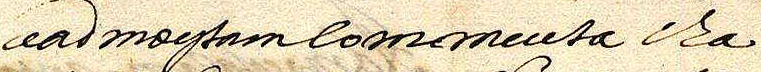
e admoestam com muita cha
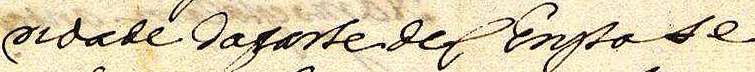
ridade da parte de Christo se
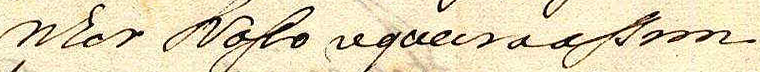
nhor Nosso o queira assim
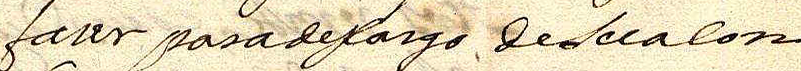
fazer para desCargo de sua con
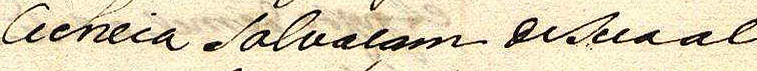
Ciencia saluaçam de sua al
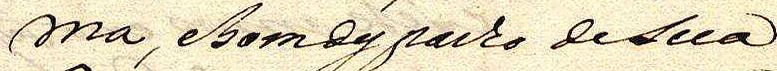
ma, e bom despacho de sua
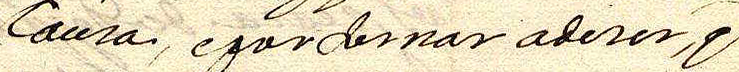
Cauza, e por tornar a dizer, q̄
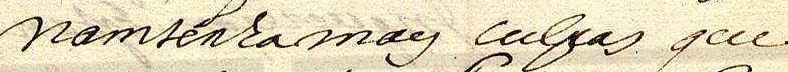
nam tenha maes culpas que
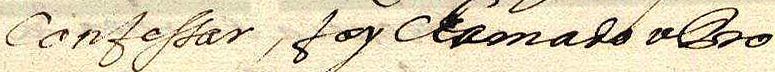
confessar, foy chamado o Pro
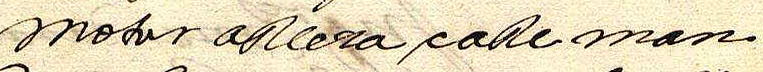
motor a Meza, e a Re man
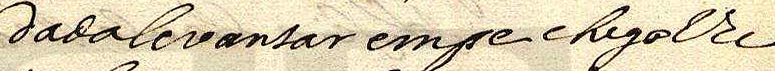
dada levantar em pe e logo lhe
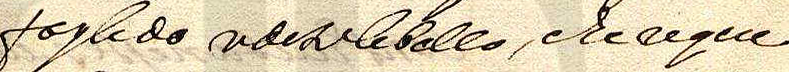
foy lido o dito lebello, e he o que
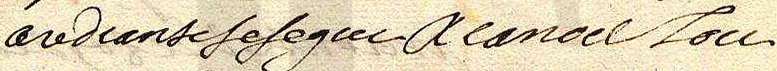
aodiante se segue Manoel Lou
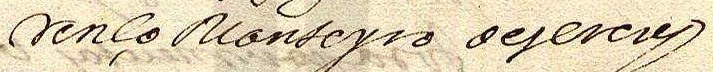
renÇo Monteyro o escrevj
